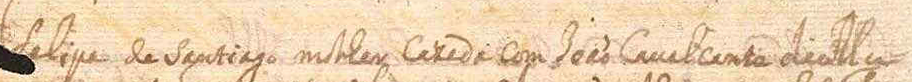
Felipa de Santiago molher cazada com Ioaõ Caualcanti de Alu
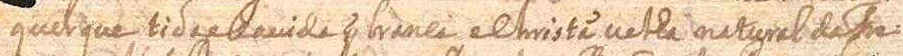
querque tida e hauida p̄ branca e Christã uelha natural de Fre
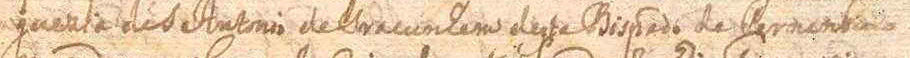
guezia de S Antonio de Tracunhem deste Bispado de Pernambuco
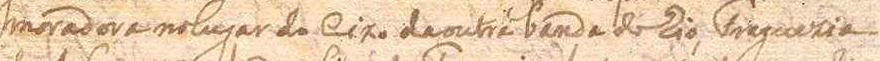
moradora no lugar do Eixo de outra banda do Rio, Freguezia
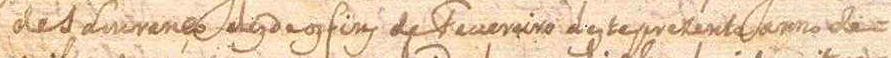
de S Lourenço dezde oz fins de Feuereiro dezte prezente anno de
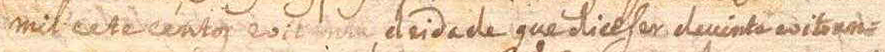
mil setecentoz e oit_nta, de idade que dice ser de uinte e oito an
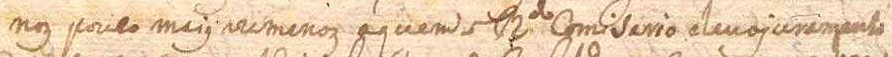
nos pouco mais ou menoz, a quem o R.do Comisario deu o juramento
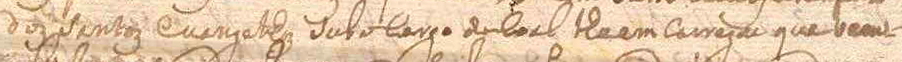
dos Santoz Euangelhoz sub o Cargo do Coal lhe emCarregou que bem
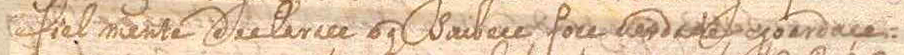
e fielmente declaraçe o q̄ Soubece, foce uerdade, e goardace
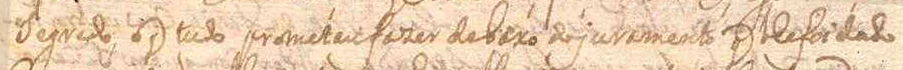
Segredo, o q̄ tudo prometeu fazer debaxo do juramento q̄ lhe foi dado
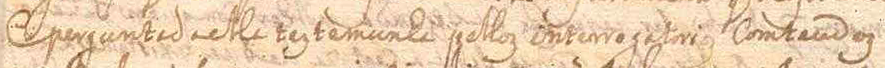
E perguntada ella testemunha pellos interrogatorioz Comteudoz
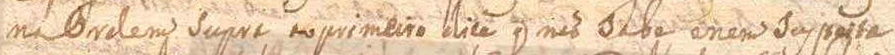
na Ordem supra, ao primeiro dice q̄ naõ Sabe, e nem suspeita
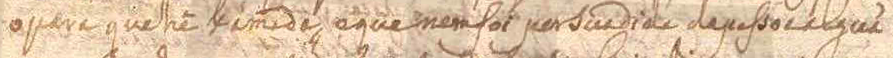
o para que hé xamada, e que nam foi persuadida de pessoa alguā
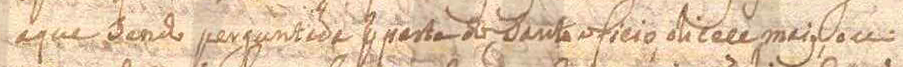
a que sendo perguntada p̄ parte do Santo oficio dicece mais, ou
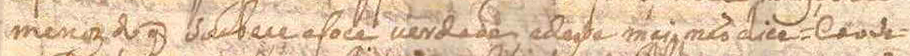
menoz do q̄ soubece e foce uerdade, e deste mais não dice = E ao se
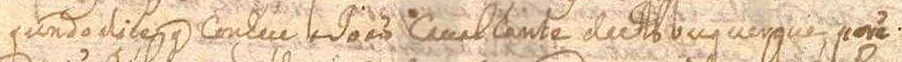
gundo dice q̄ Conhece a Ioaõ CaualCante de Albuquerque porē
